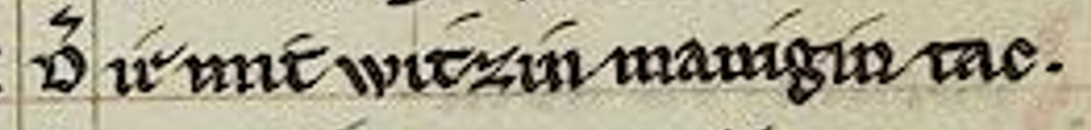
D(er) ir mit witzin manigin tac.
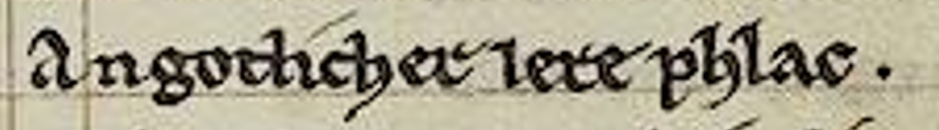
An gotlicher lere phlac.
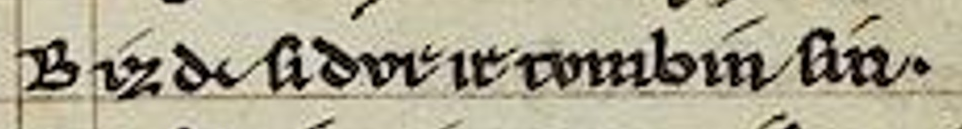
Biz d(az) ſi dvr ir tvmbin ſin.
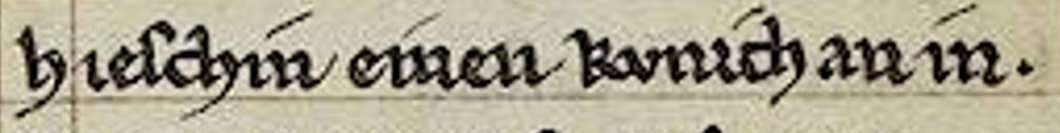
Hieſchin einen kvnich an in.
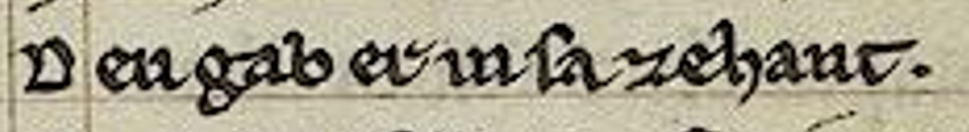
Den gab er in ſa zehant.
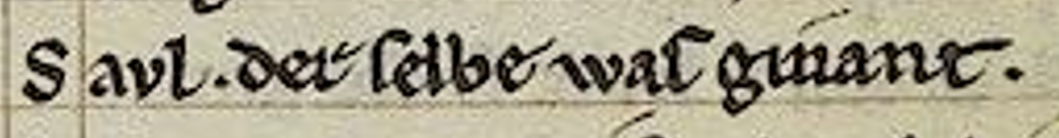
Savl. der ſelbe waſ ginant.
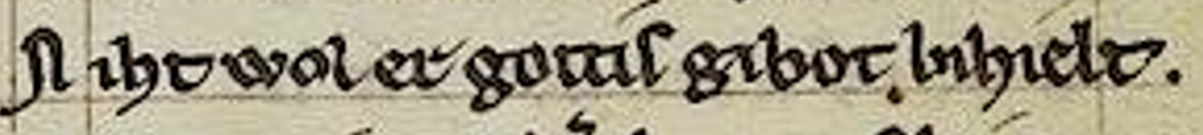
Niht wol er gottiſ gibot bihielt.
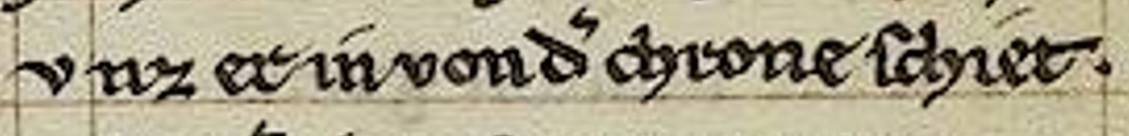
Vnz er in von d(er) chrone ſchiet.
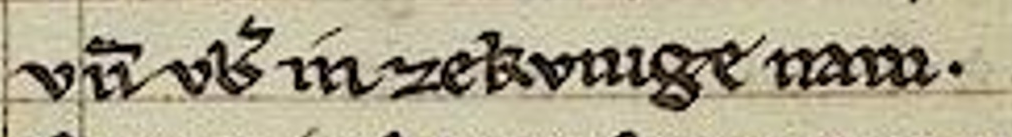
Vn(d) vb(er) in zekvnige nam.
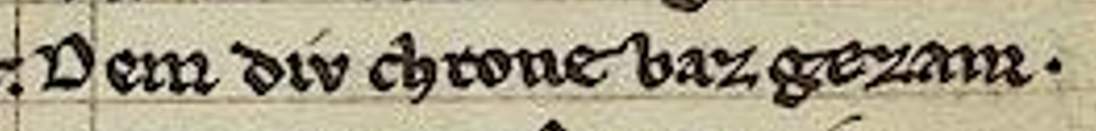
Dem div chrone baz gezam.
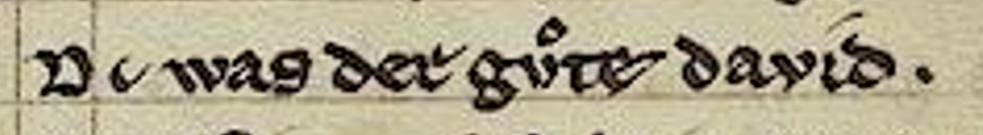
D(az) was der gv°ote david.
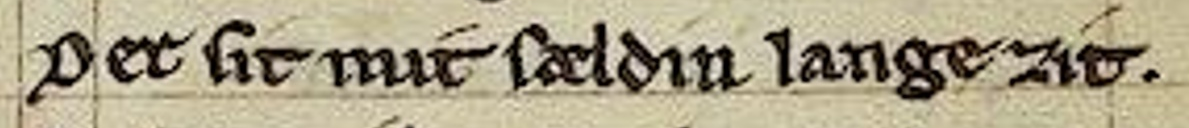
Der ſit mit ſ[ae]ldin lange zit.
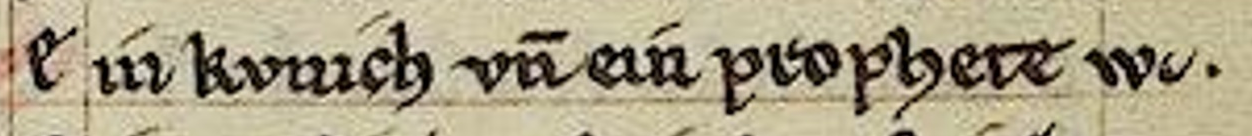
Ein kvnich vn(d) ein prophete w(az).
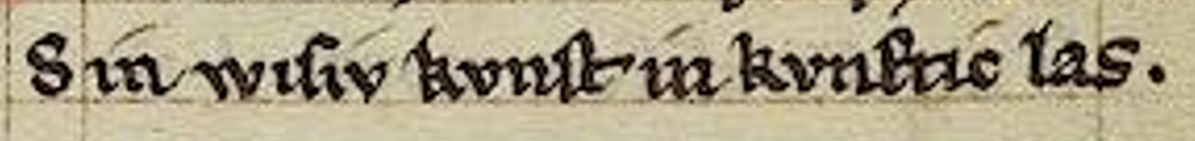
Sin wiſiv kvnſt in kvnftic las.
